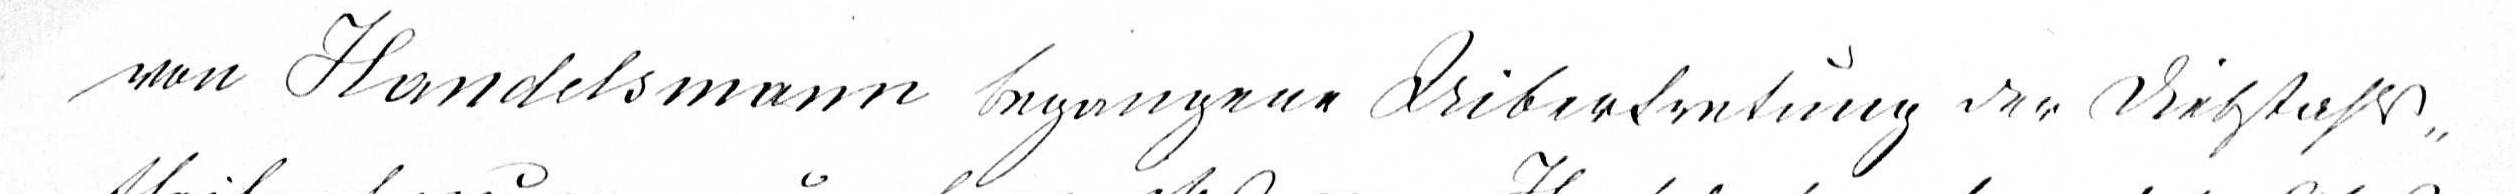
von Handelsmann begangenen Uibertretung der Diebstahls¬
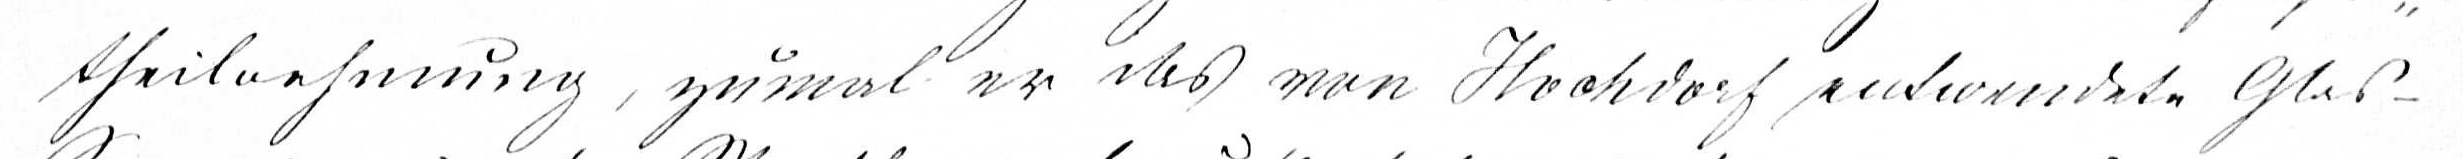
theilnehmung, zumal er das von Hochdorf entwendete Glas-
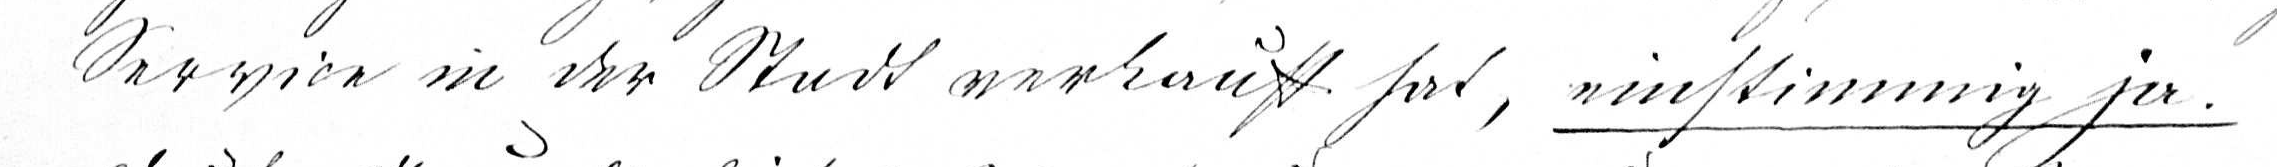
Service in der Stadt verkauft hat, einstimmig ja.
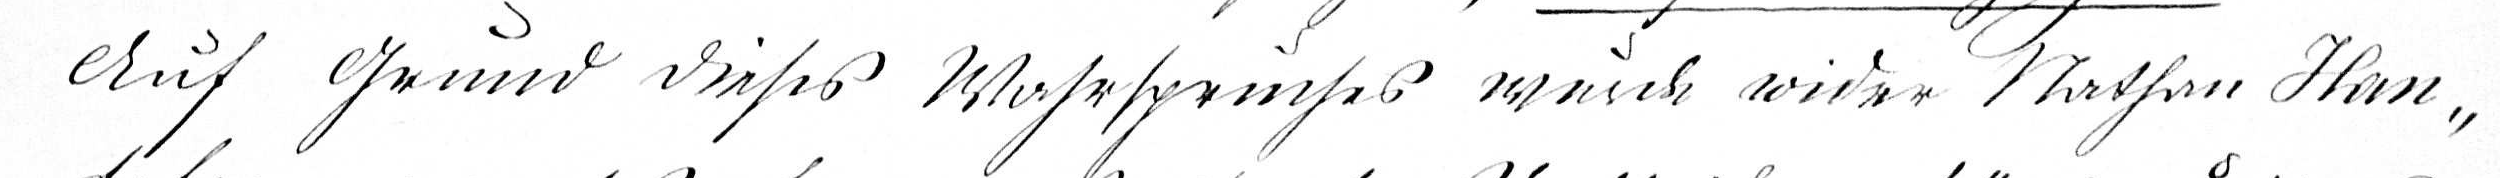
Auf Grund dieses Wahrspruches wurde wider Nathan Han¬
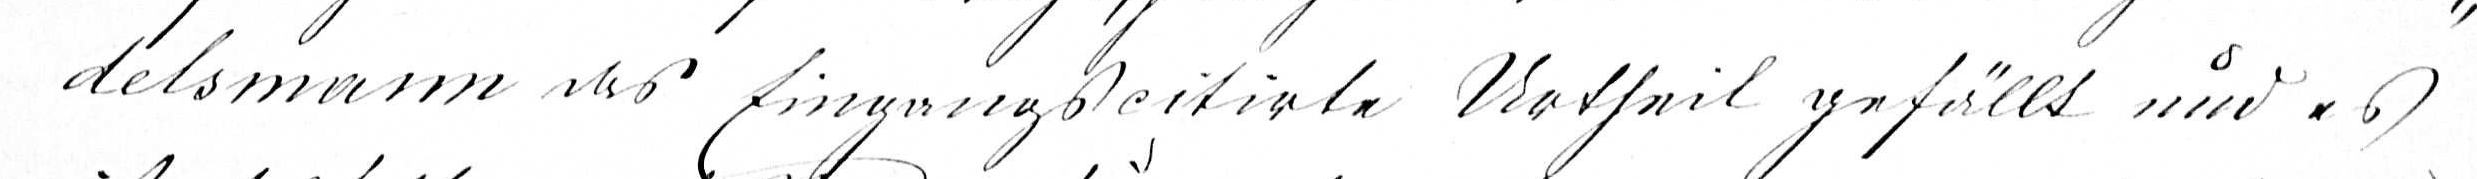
delsmann das Eingangscitirte Urtheil gefällt und es
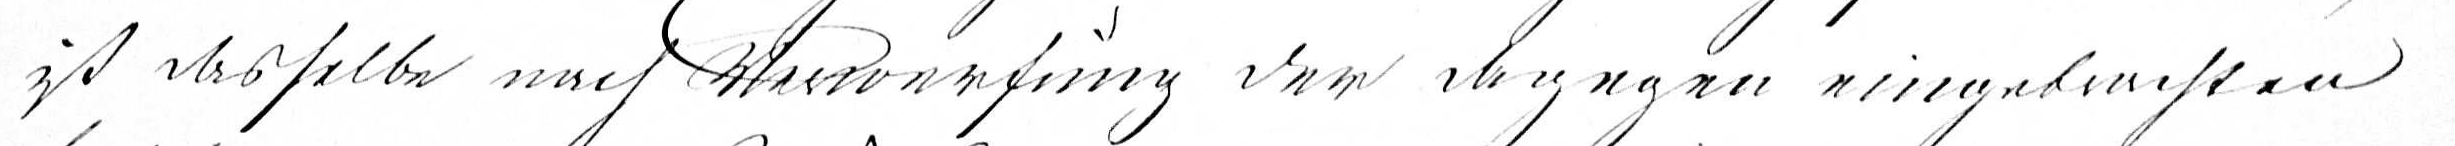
ist desselbe nach Verwerfung der dagegen eingebrachten
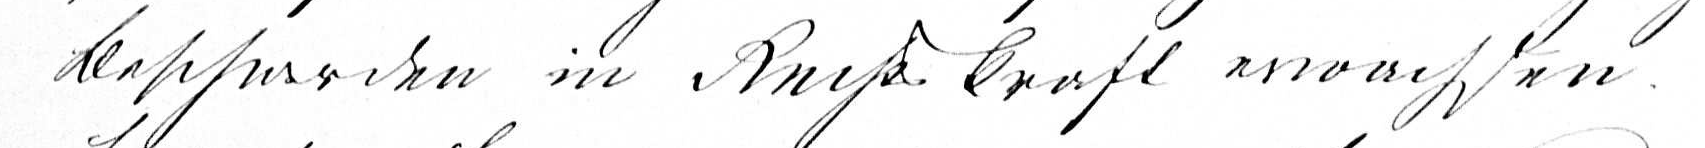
Beschwerden in Rechtskraft erwachsen.
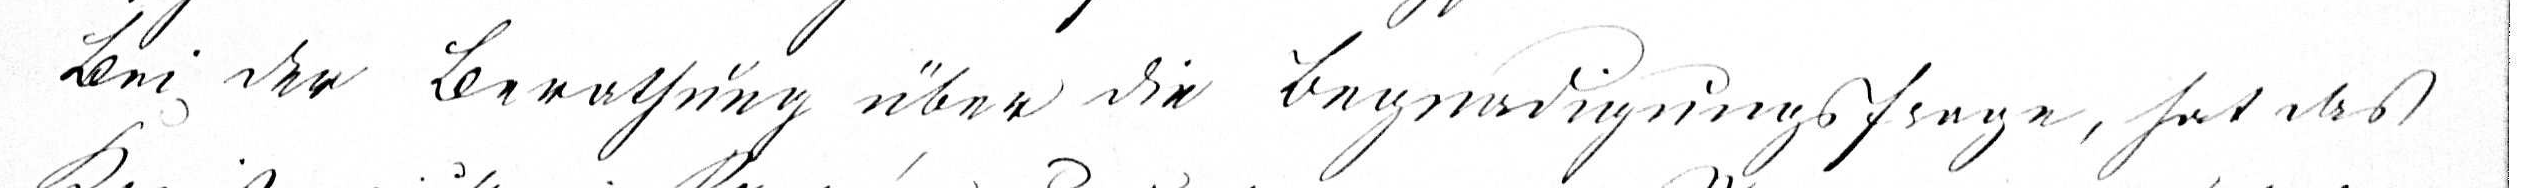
Bei der Beratung über die Begandigungsfrage, hat das
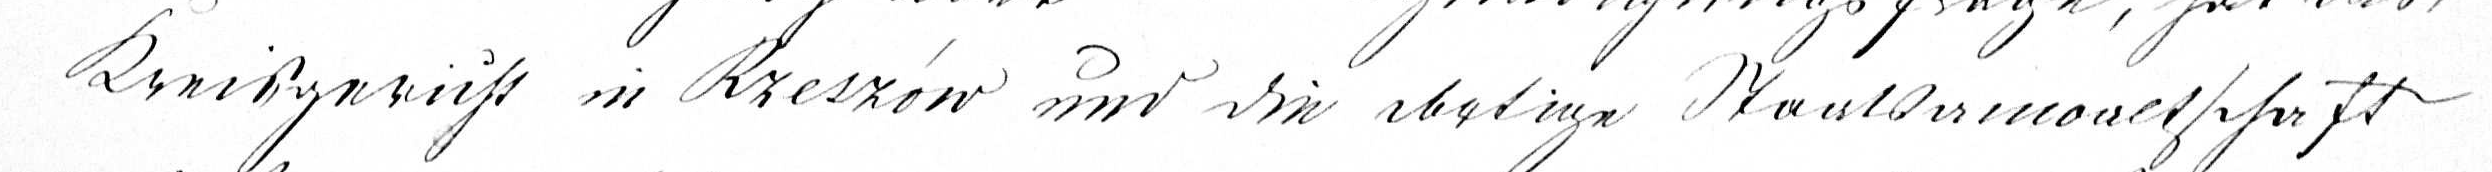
Kreisgericht in Rzeszów und die dortige Staatsanwaltschaft
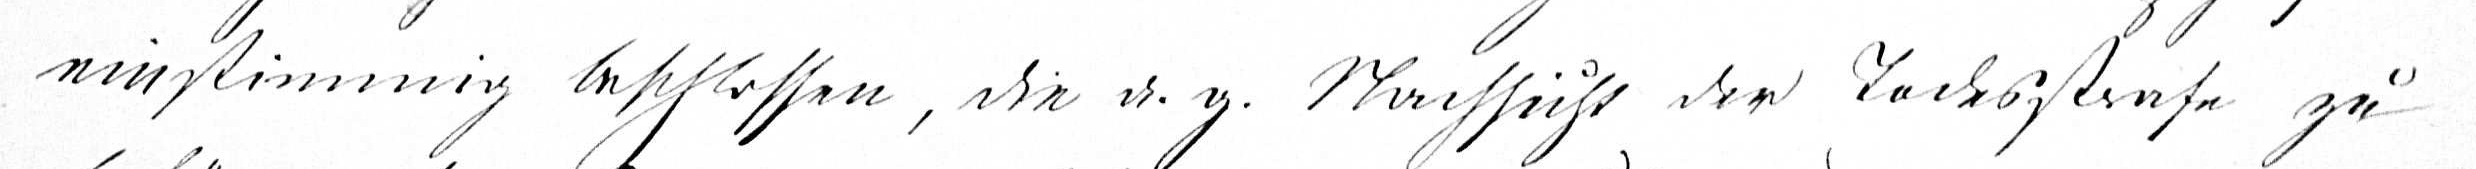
einstimmig beschlossen, die a.g. Nachsicht der Todesstrafe zu
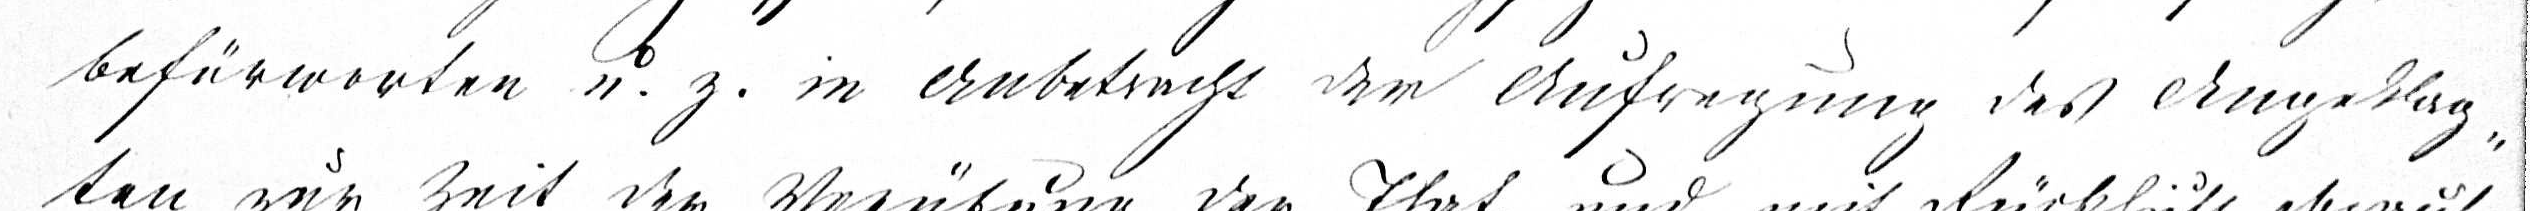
befürworten u.z. in Anbetracht der Aufregung des Angeklag¬
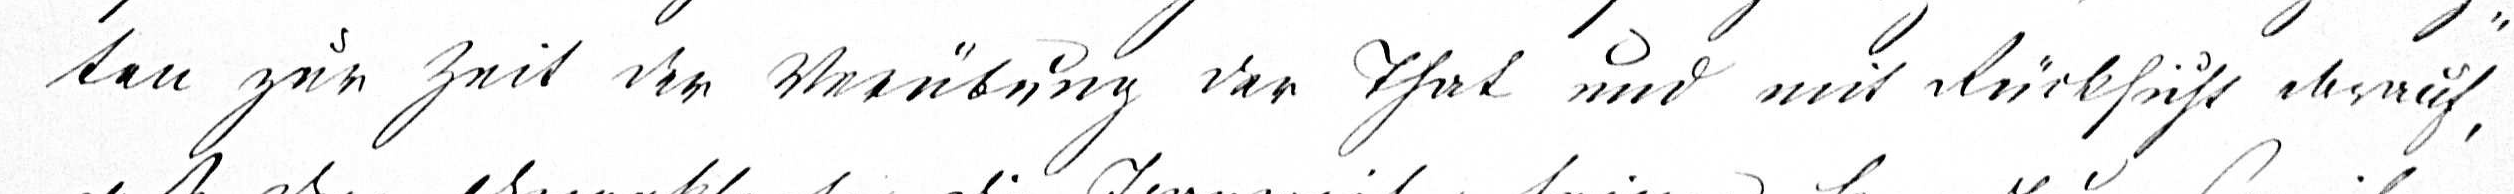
ten zur Zeit der Verübung der That und mit Rücksicht darauf,
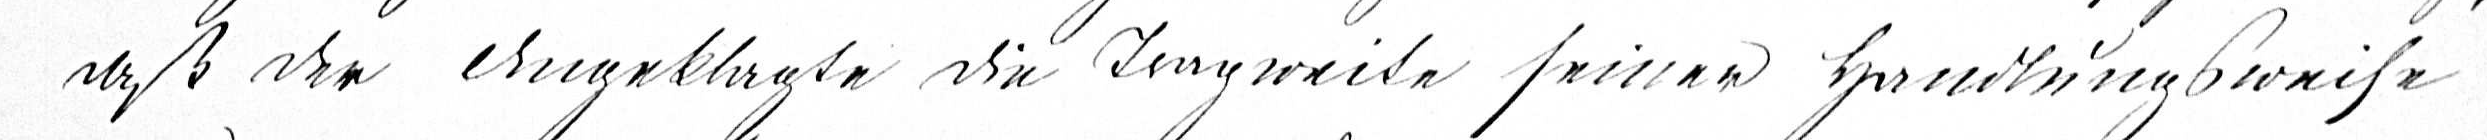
daß der Angekagte die Tragweite seiner Handlungsweise
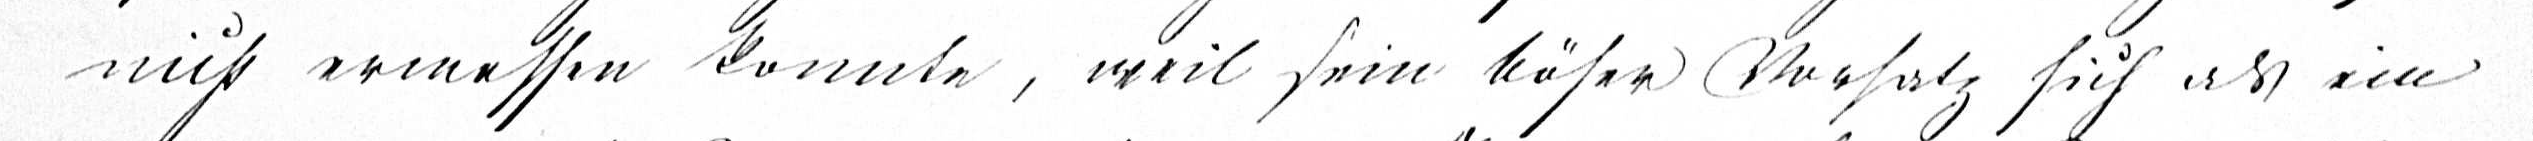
nicht ermessen konnte, weil sein böser Vorsatz sich als ein
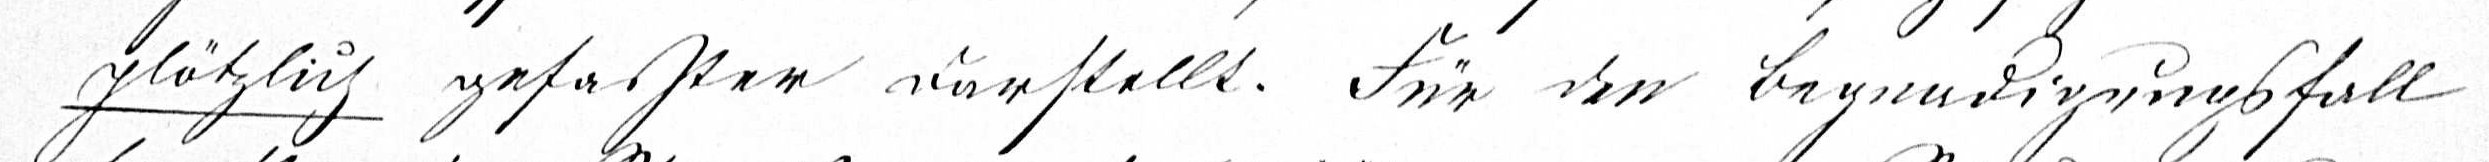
plötzlich gefaßter darstellt. Für den Begnadigungsfall
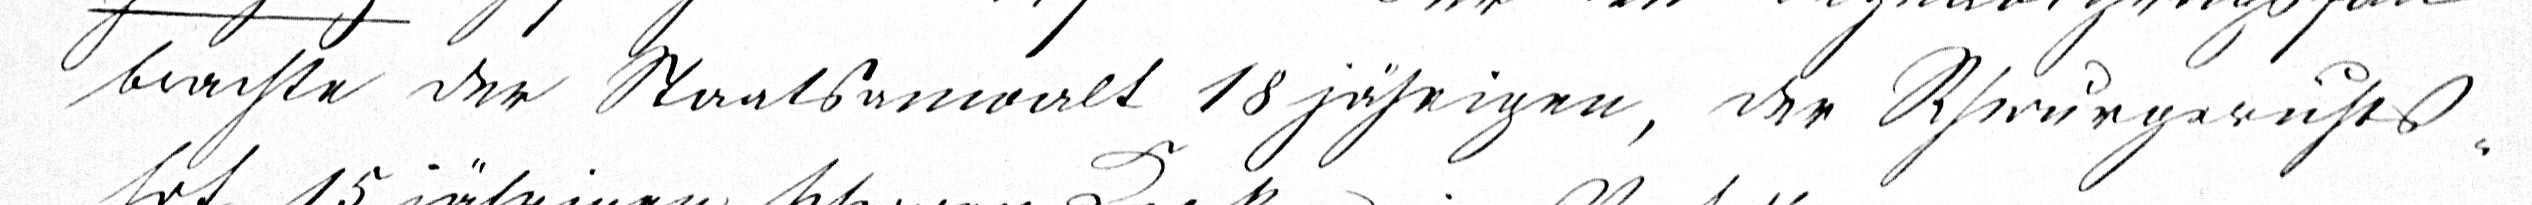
beachte der Staatsanwalt 18jährigen, der Schwurgerichts¬
